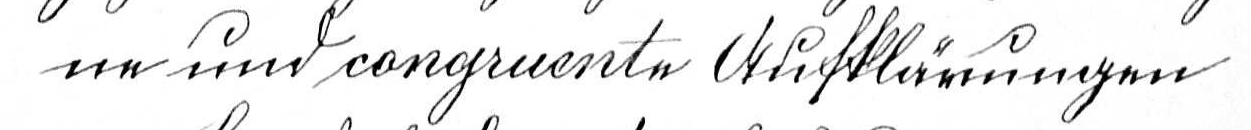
ne und congruente Aufklärungen
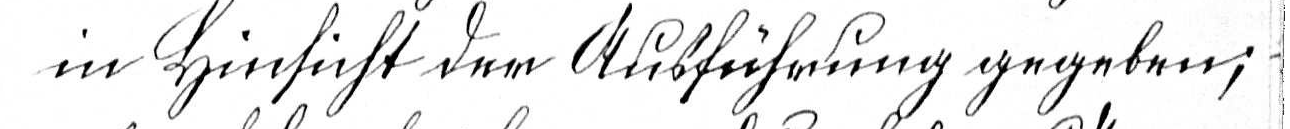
in Hinsicht der Ausführung gegeben;
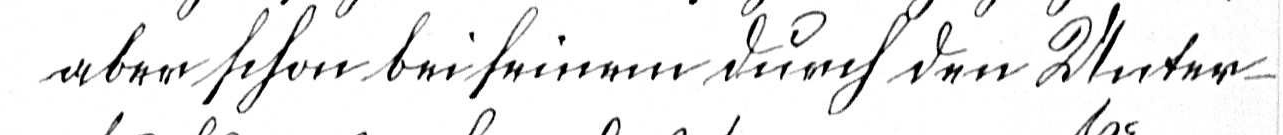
aber schon bei seinem durch den Unter¬
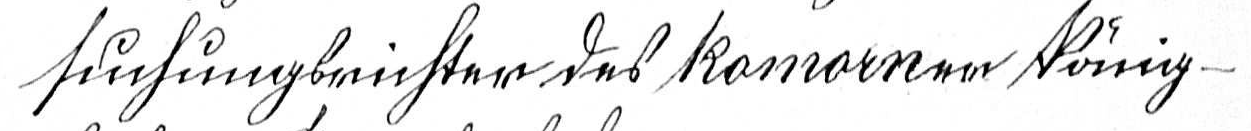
suchungsrichter des komorner könig¬
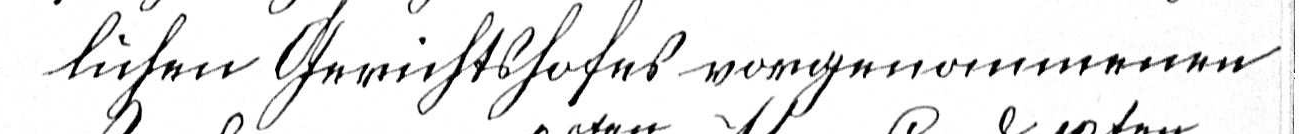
lichen Gerichtshofes vorgenommenen
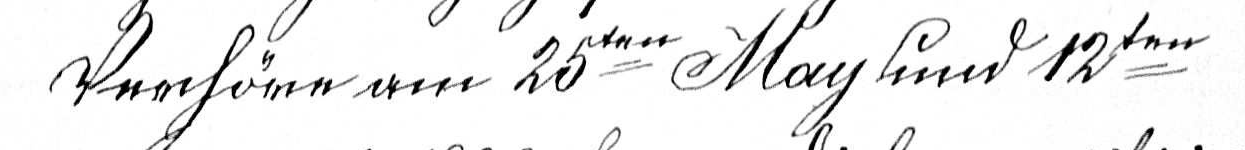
Verhöre am 25ten May und 12ten
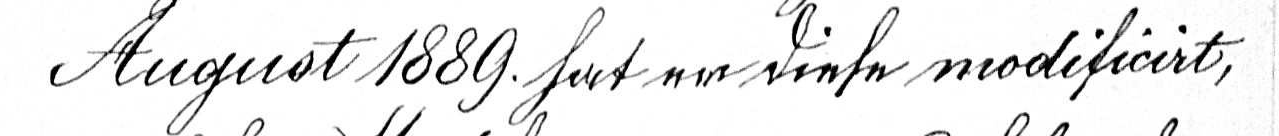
August 1889 hat er diese modificirt,
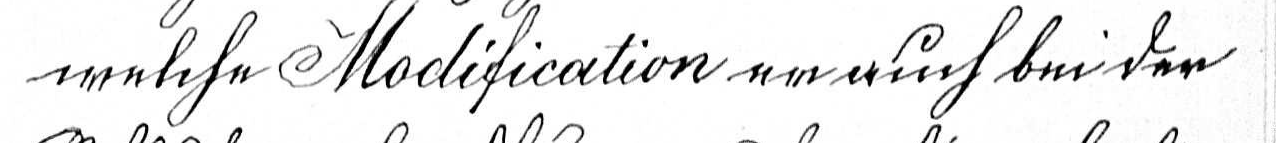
welche Modification er auch bei der
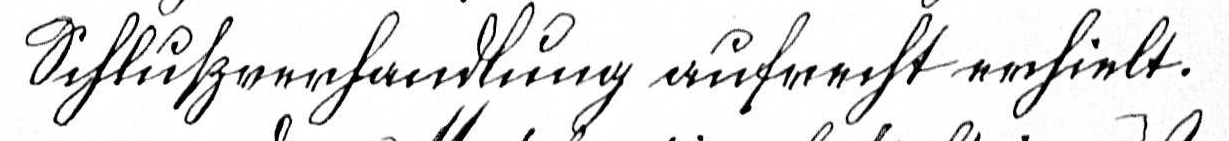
Schlußverhandlung aufrecht erhielt.
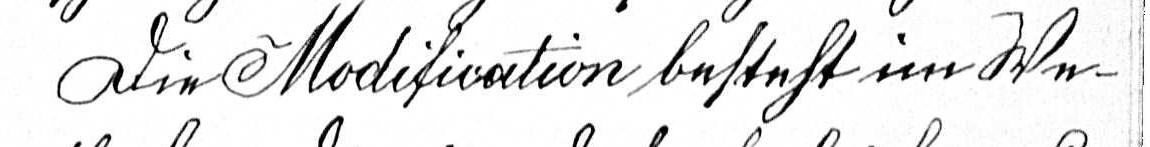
Die Modification besteht im We¬
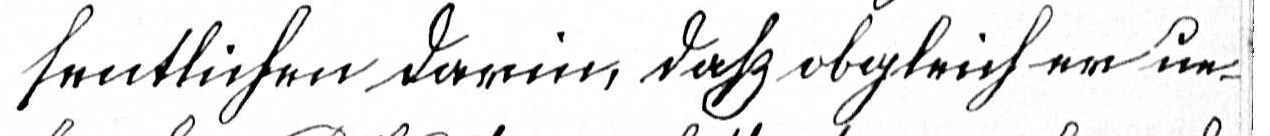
sentlichen darin, daß obgleich er ue¬
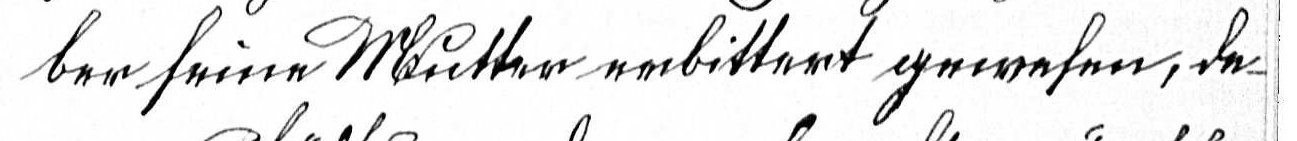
ber seine Mutter erbittert gewesen, de¬
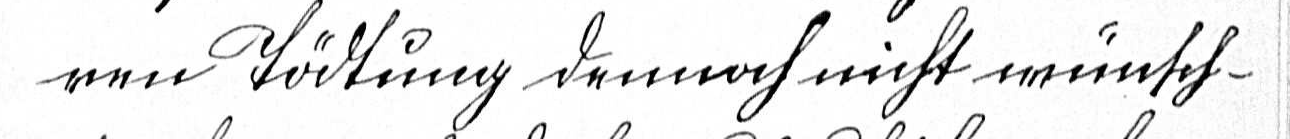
ren Tödtung dennoach nicht wünsch¬
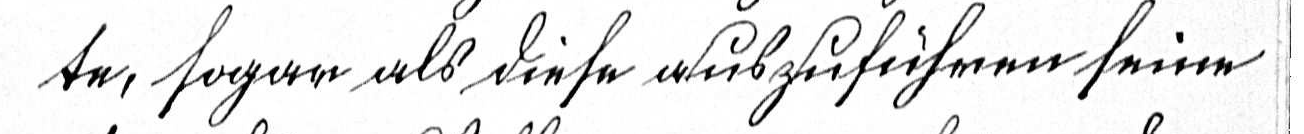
te, sogar als diese auszuführen seine
